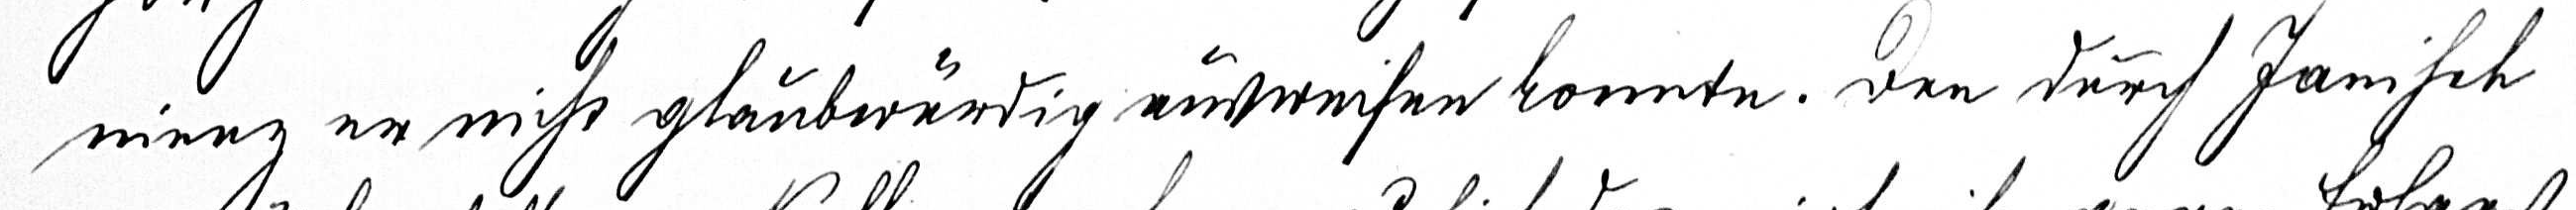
nienz er nicht glaubwürdig ausweisen konnte. Den durch Janisch
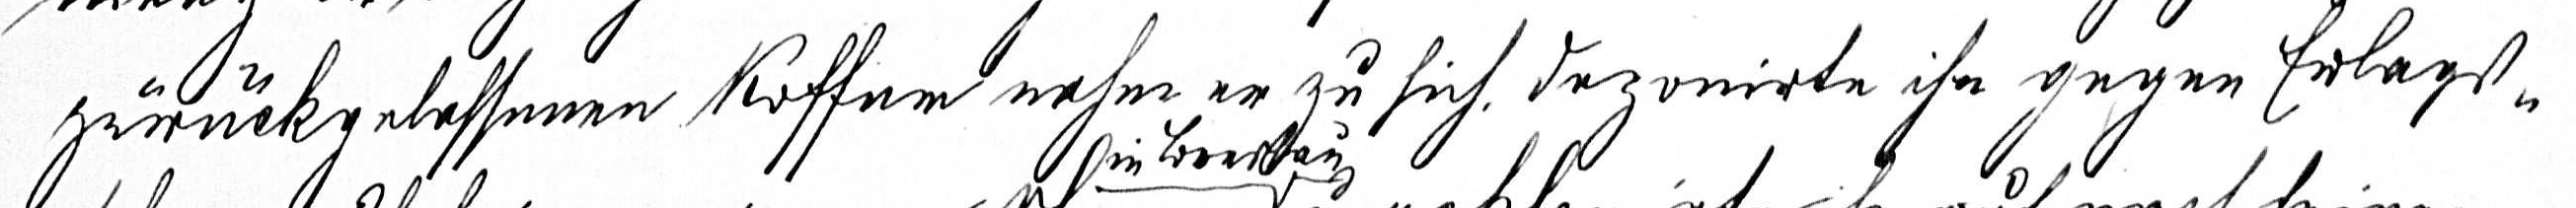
zurückgelassenen Koffer nahm er zu sich, deponirte ihn gegen Erlags¬
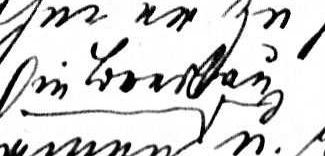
in Breslau
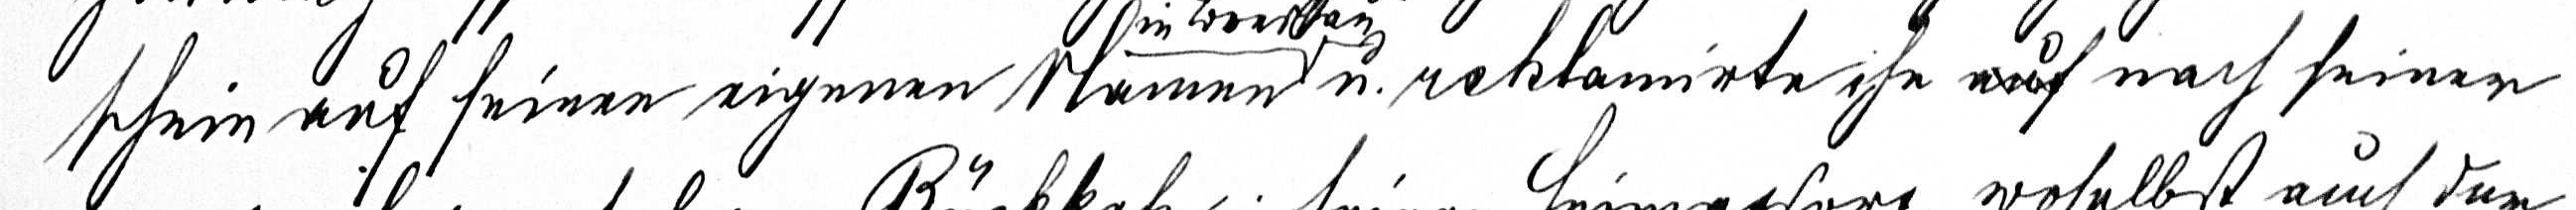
schein auf seiner eigenen Namen u reklamirte ihn nach seiner
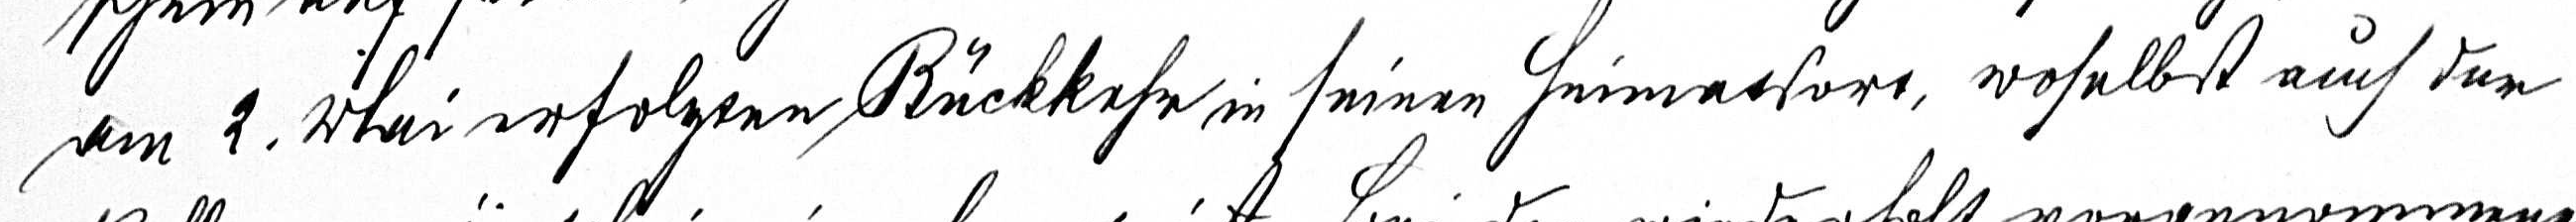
am 2. Mai erfolgten Rückkehr in seinen Heimatsort, woselbst auch der
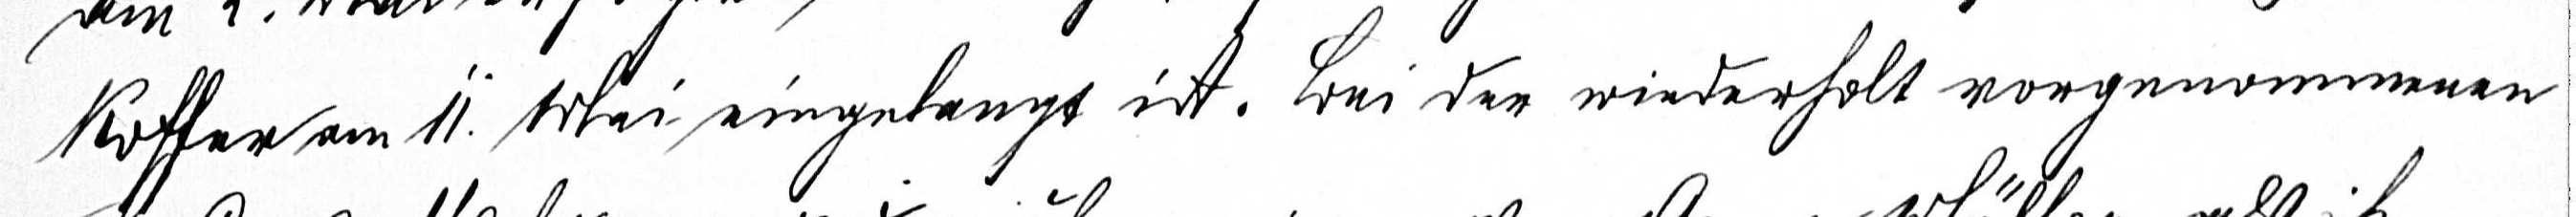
Koffer am 11 Mai eingelangt ist. Bei der wiederholt vorgenommenen
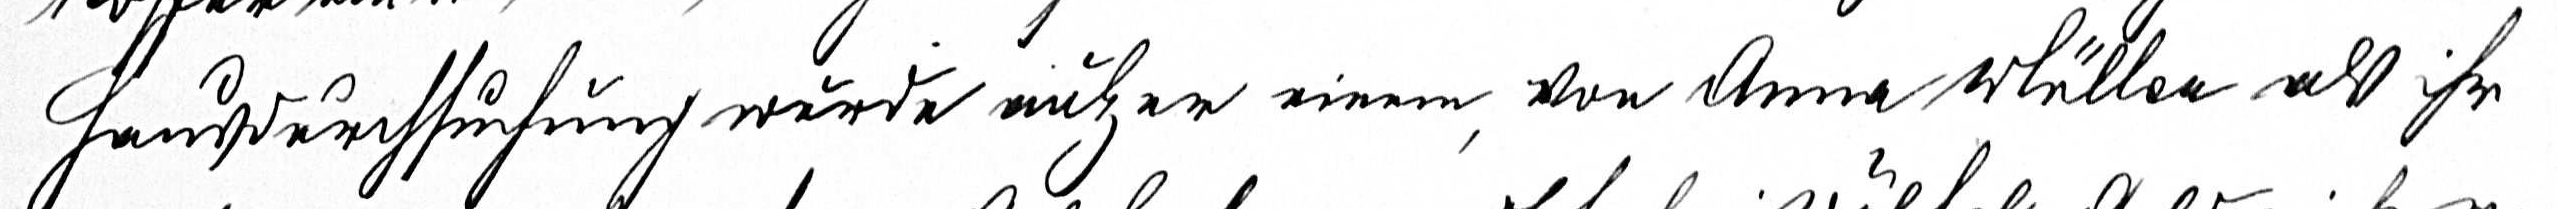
Hausdurchsuchung wurde außer einem von Anna Müller als ihr
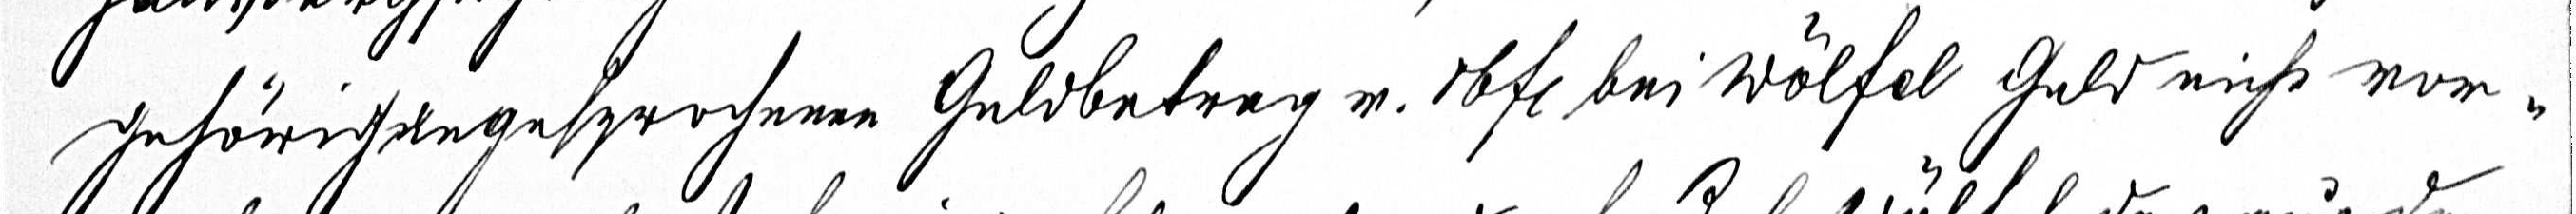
gehörigangesprochenen Geldbetrag v. 16 fl bei Wölfel Geld nicht vor¬
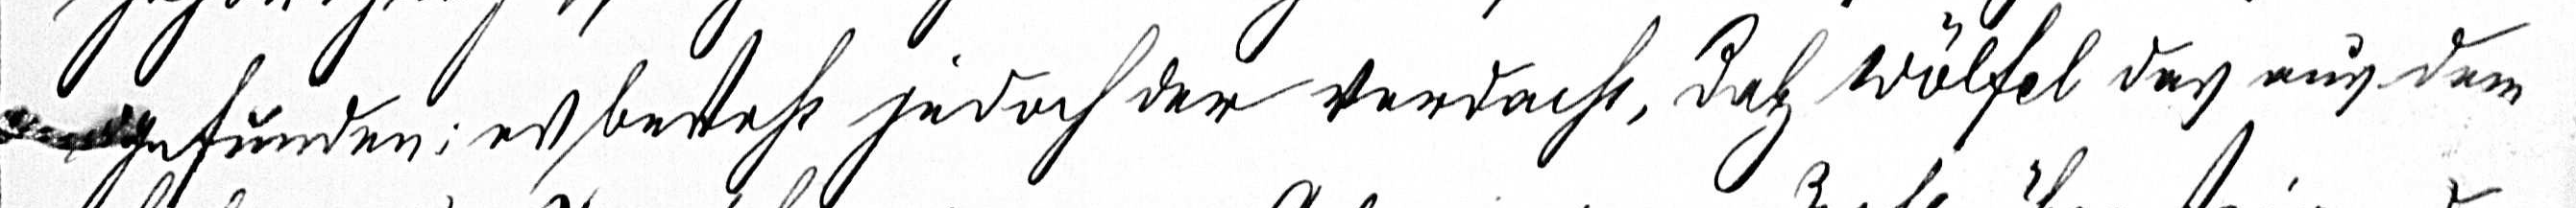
gefunden; es besteht jedoch der Verdacht, daß Wölfel das aus dem
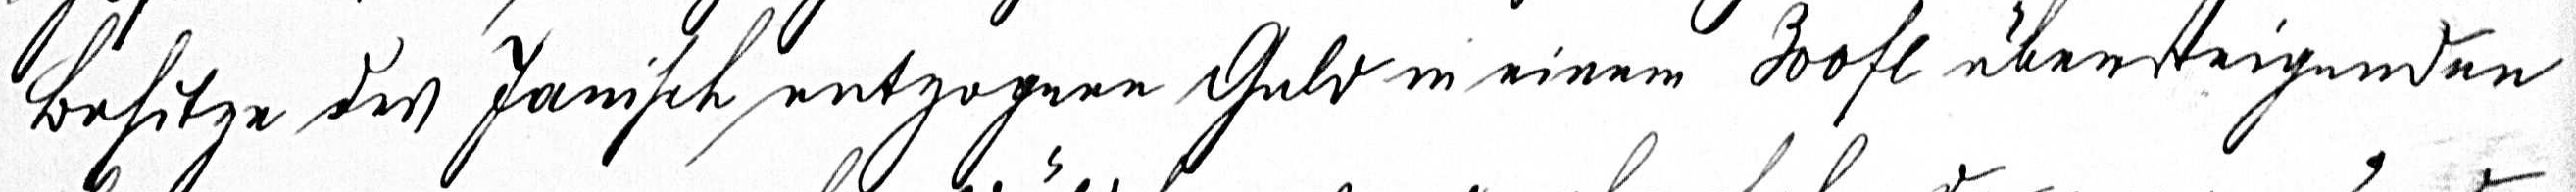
Besitze der Janisch entzogene Geld in einem 300 fl übersteigenden
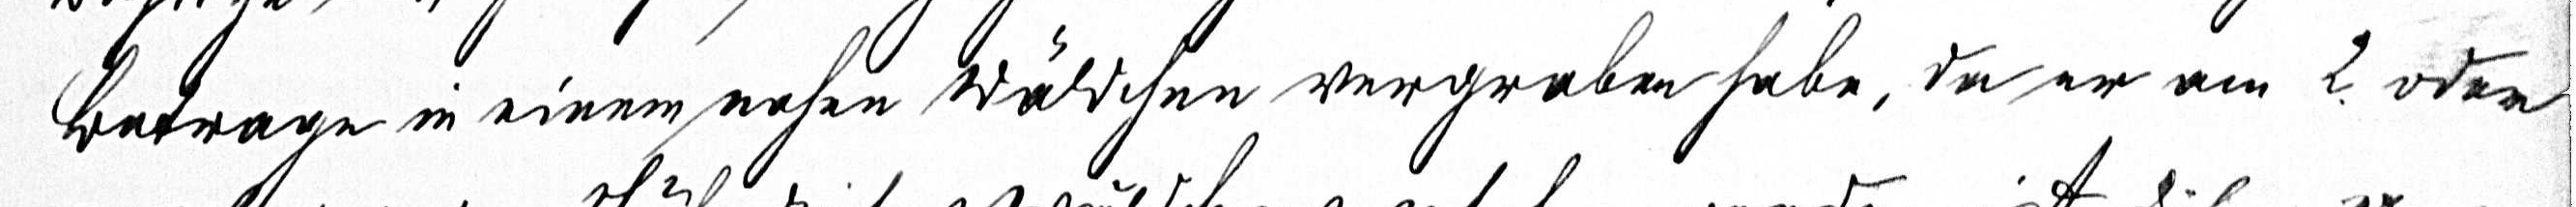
Betrage in einem nahen Wäldchen vergraben habe, da er am 2. oder
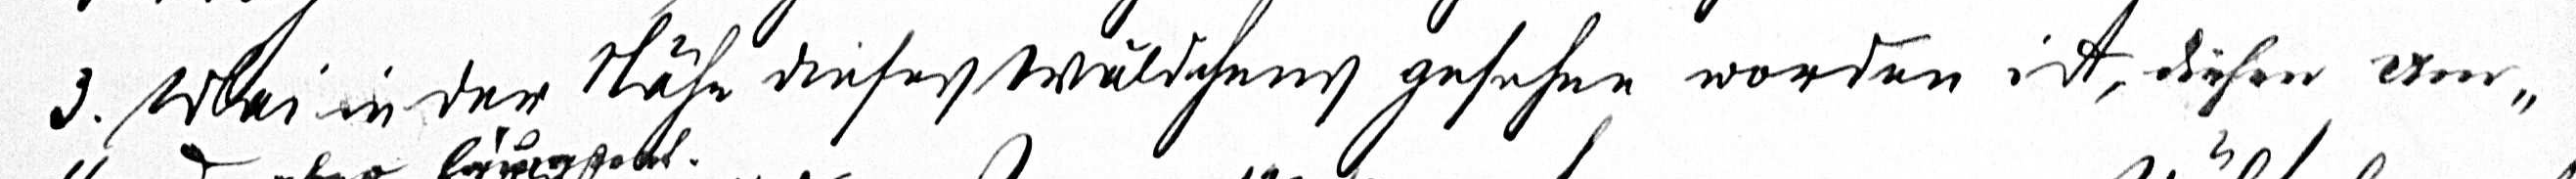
3. Mai in der Nähe dieses Waldchens gesehen worden ist, dieser Um¬
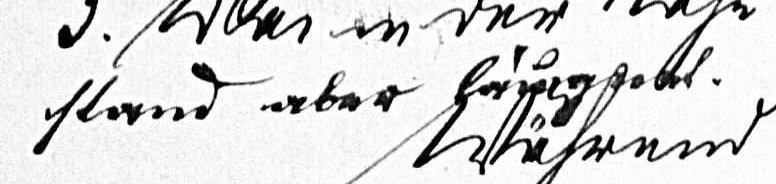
stand aber läugnet.
